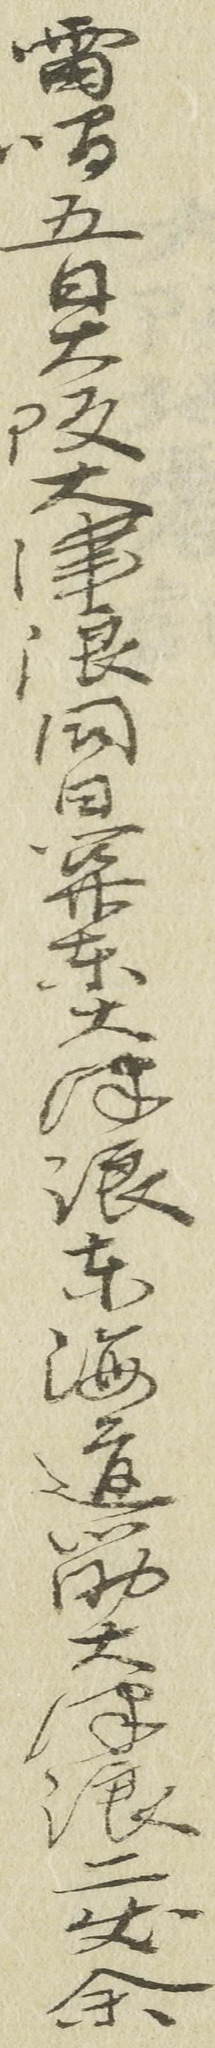雷鳴五日大阪大津浪同日關東大津浪東海道筋大津浪二丈余
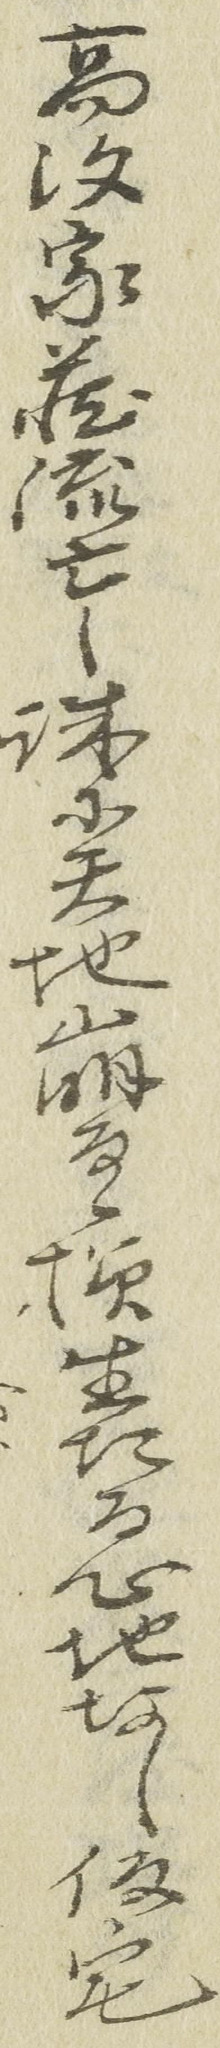高汐家蔵流亡し誠に天地崩るゝ様生たる心地なし仮宅
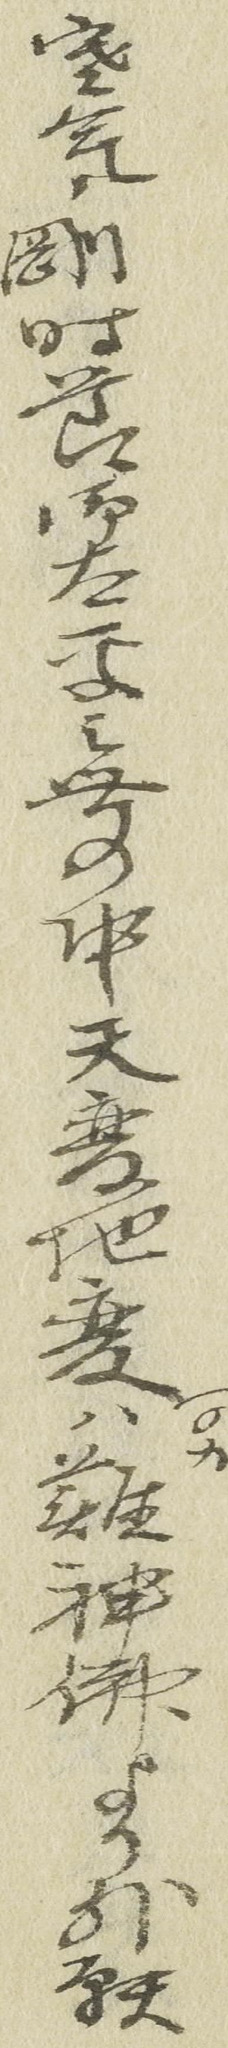寒気剛時節御太平之世の中天変地変ハ難神佛より外願
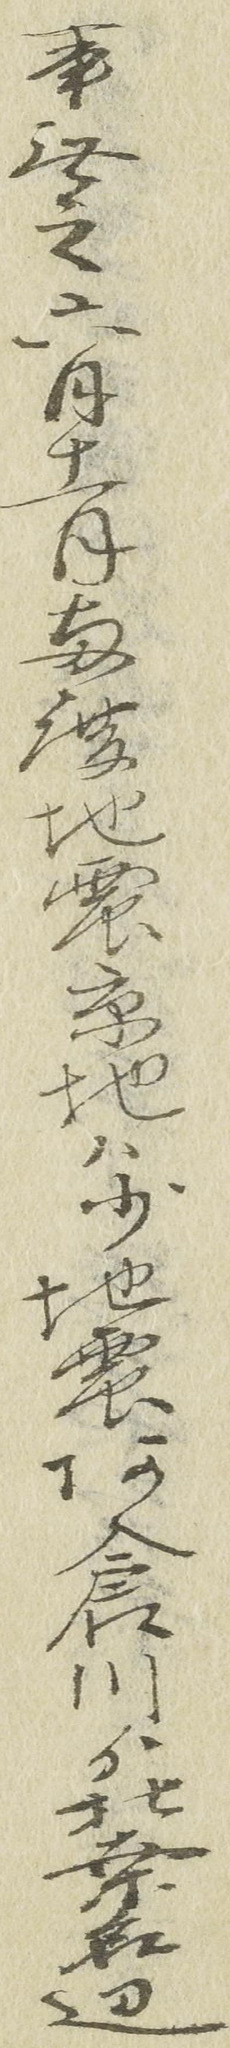事無之六月十一月毎度地震京地ハ少地震あ倉川ゟ北桑名辺
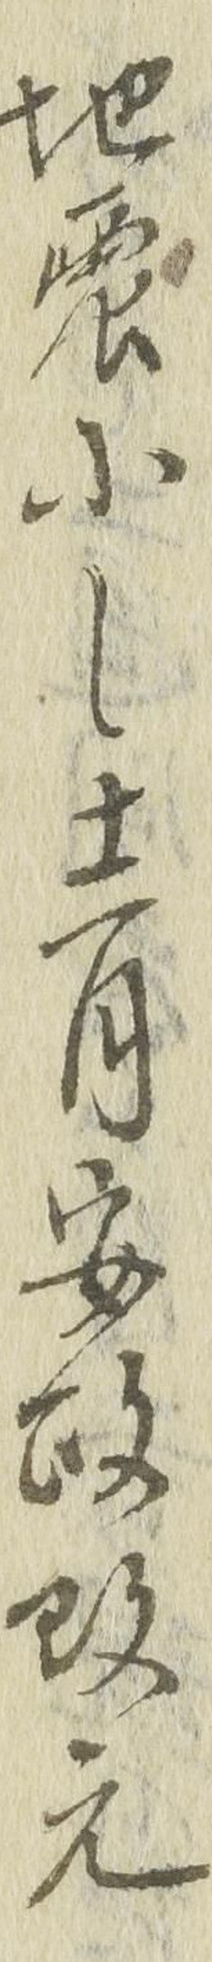地震にて十二月安政改元

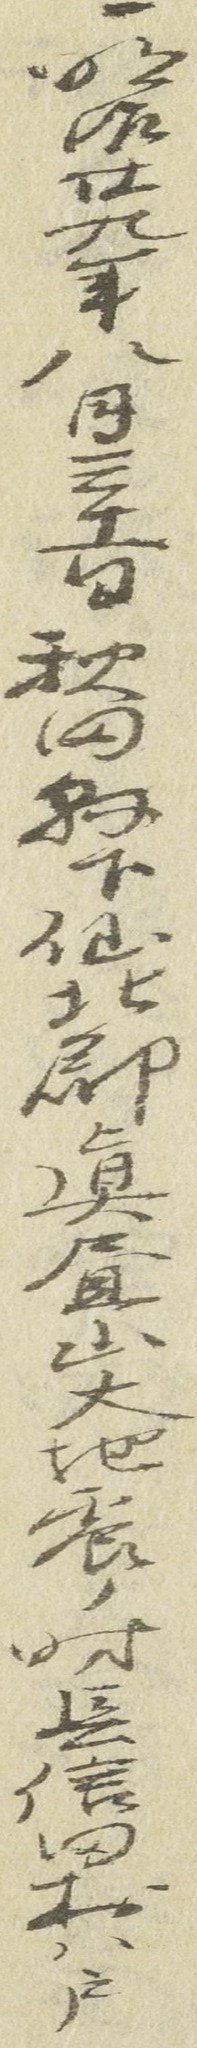一明治廿九年八月三十一日秋田縣下仙北郡眞昼山大地震ノ時長信田村ハ戸
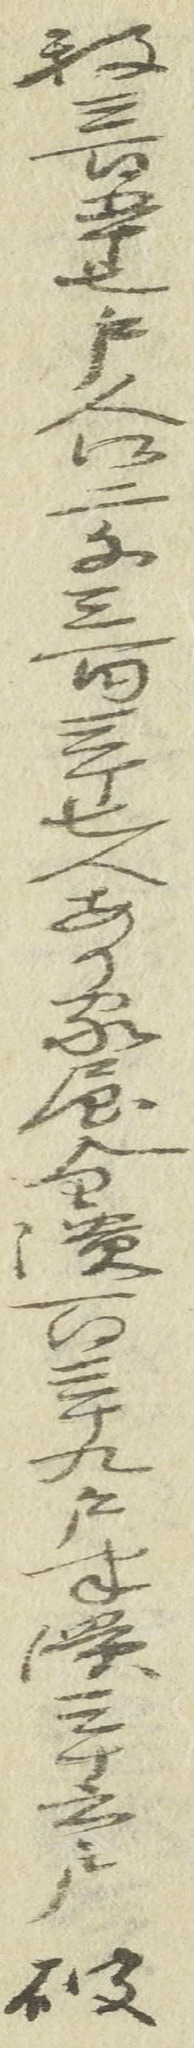数三百五十七戸人口二千三百三十七人あり家屋全潰百三十九戸半潰三十六戸破
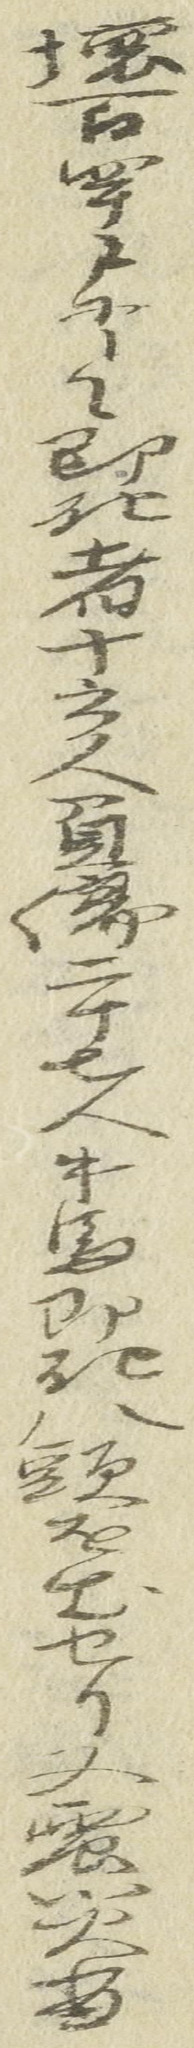壊百四十戸にして即死者十六人負傷二十七人牛馬即死八頭を出せり又震災当
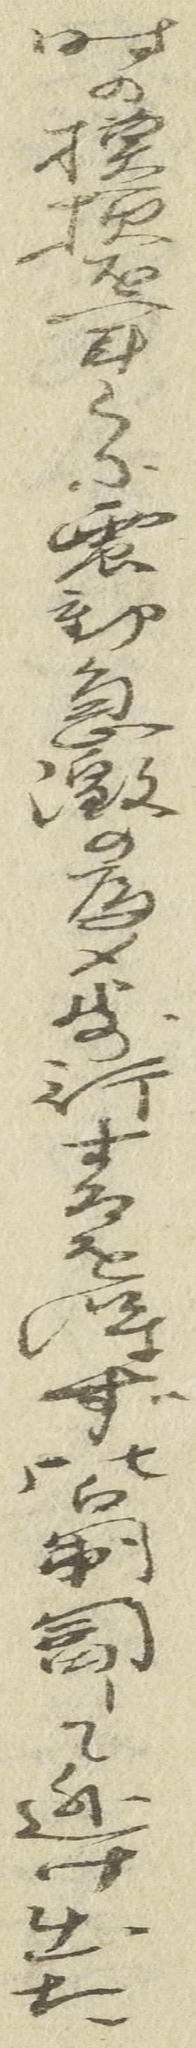時の模様を聞くに震動急激の為メ歩行するを得ず皆匍匐して逃け出た
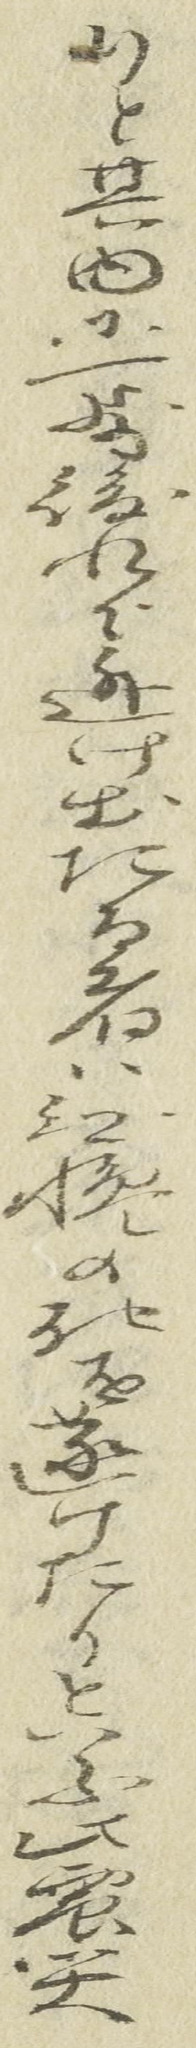りと其内に一歩後れて逃け出たる者ハ無惨の死を遂けたりといふ此震災
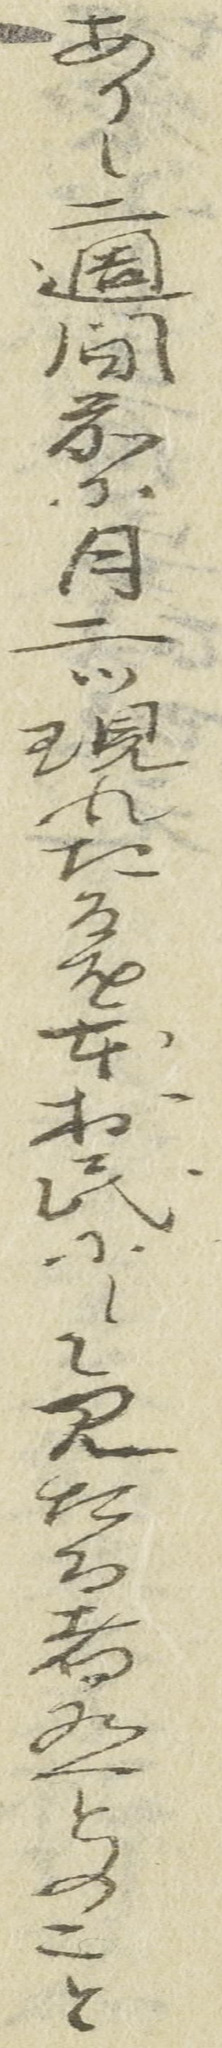ありし二週間前に月二ツ現れたるを本村民にして見たる者有とのこと
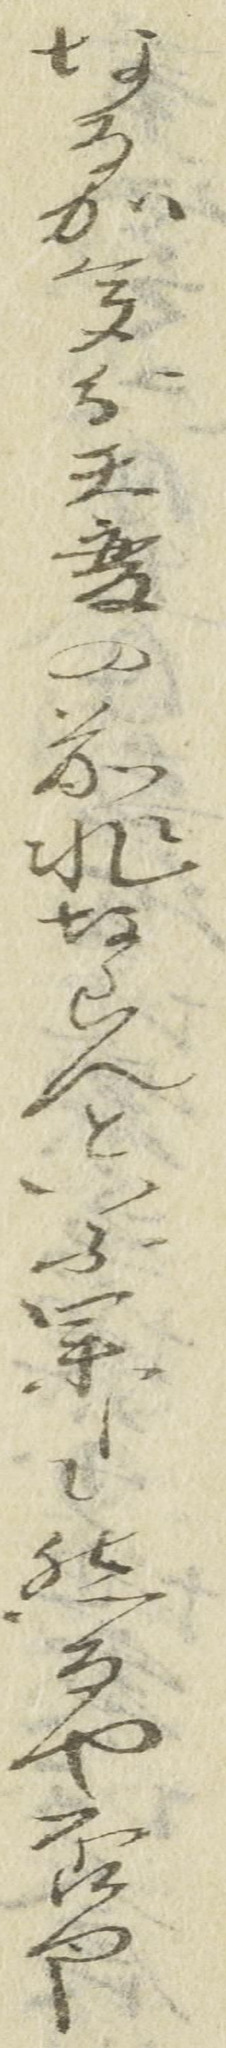なるか多分天変の前兆ならんといふ果して然るや否や
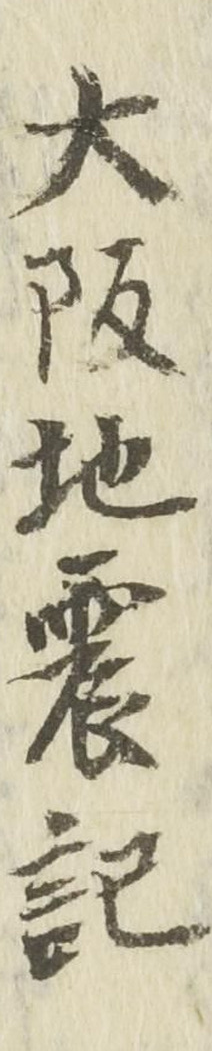大阪地震記
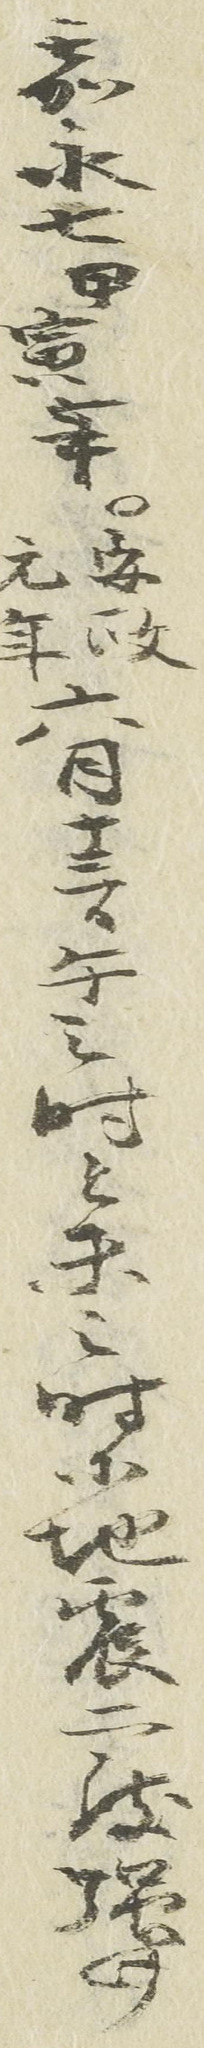嘉永七甲寅年。安政元年六月十三日午之時と未之時に地震二度強此
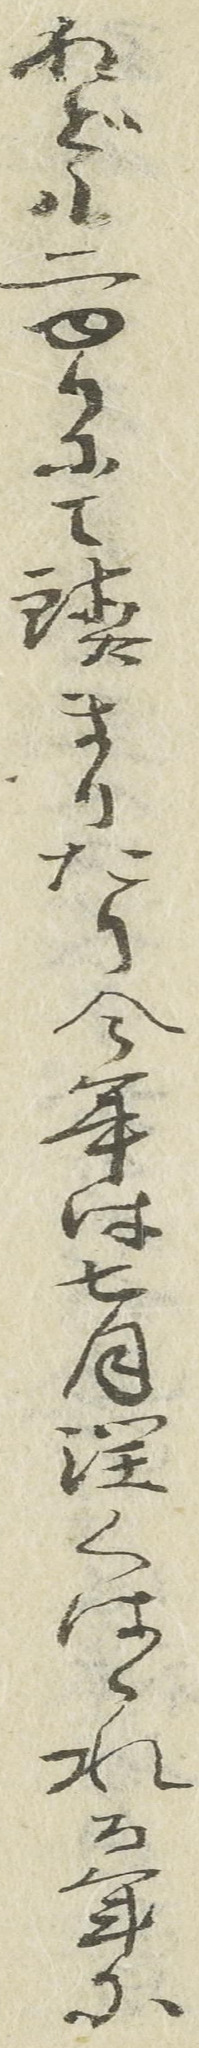れども二ゆりにて鎮まりたり今年は七月潤くはゝれる年に
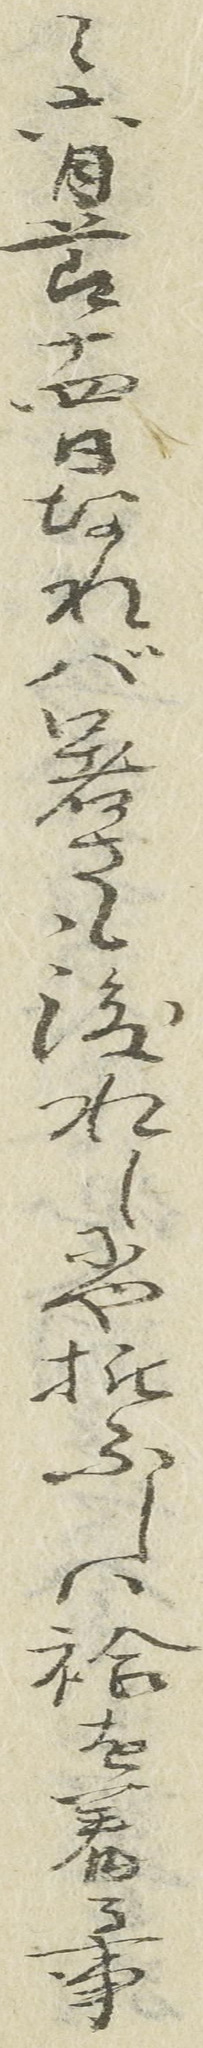て六月節十四日なれば暑さも後れしにや折ふしハ袷を着る事
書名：地震前兆集　全
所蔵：東京大学地震研究所図書室 Earthquake Research Institute Library, The University of Tokyo, JAPAN
